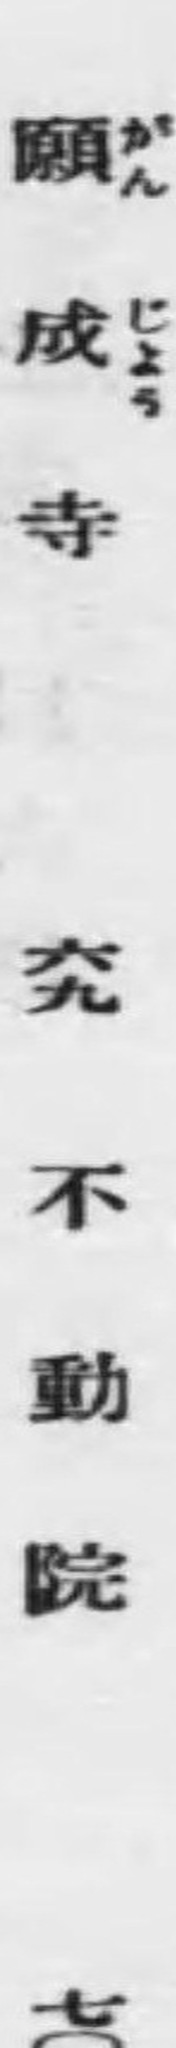願城寺六九不動院七〇
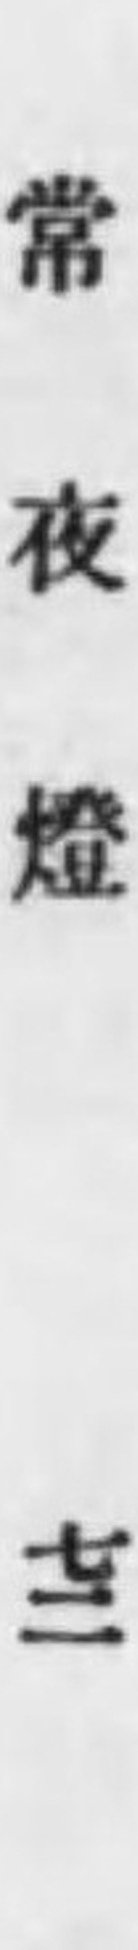常夜燈七二
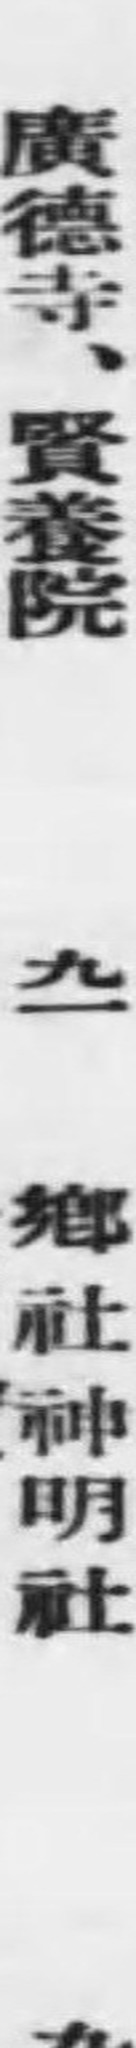廣徳寺、賢養院九一郷社神明社九三

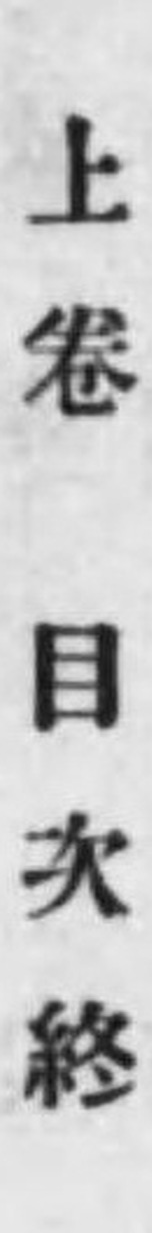上巻目次終
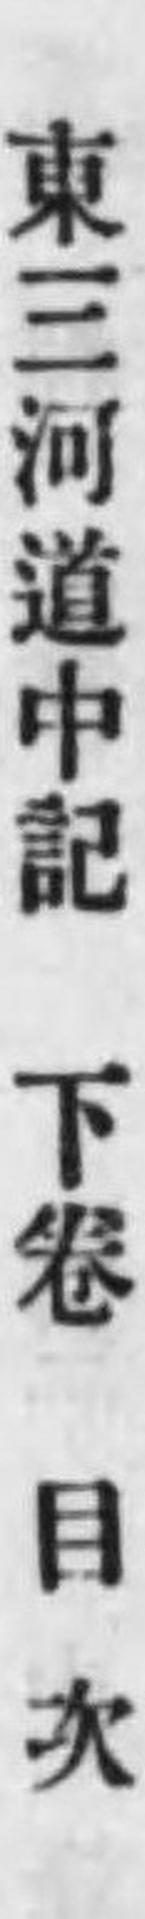東三河道中記下巻目次
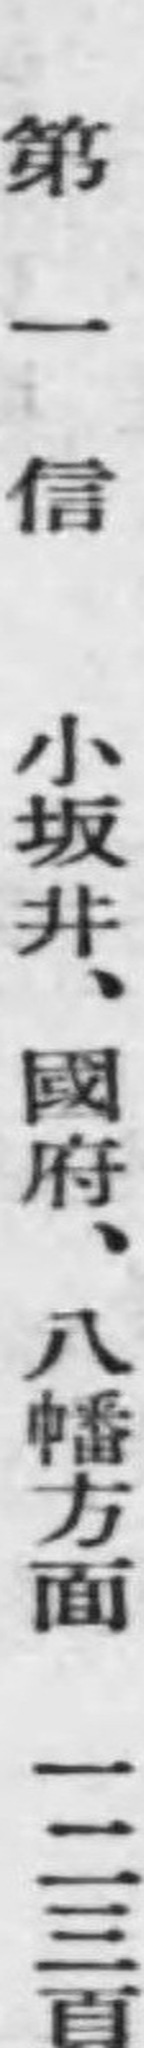第一信小坂井、國府、八幡方面一二三頁

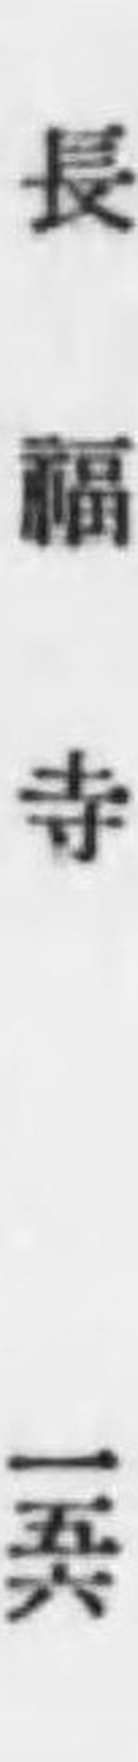長福寺一五六
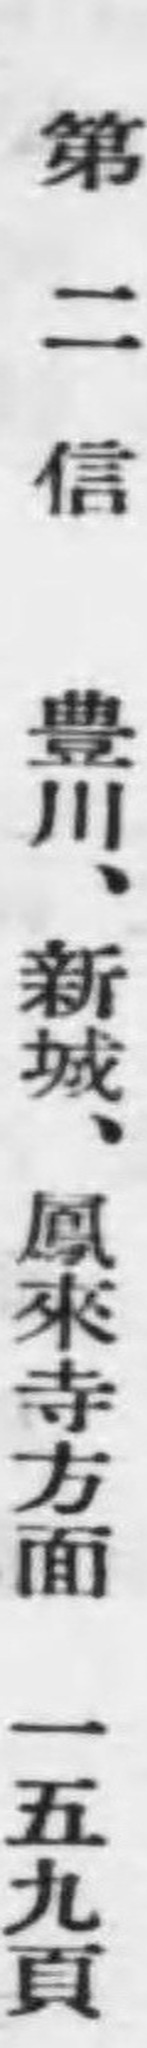第二信豊川、新城、鳳来寺方面一五九頁
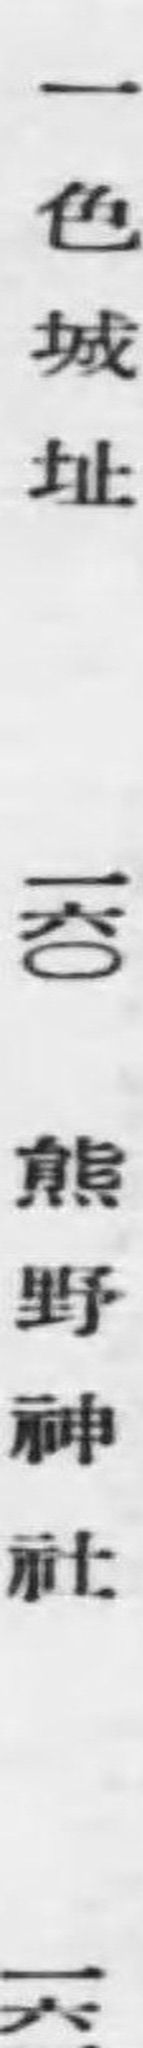一色城址一六〇熊野神社一六一
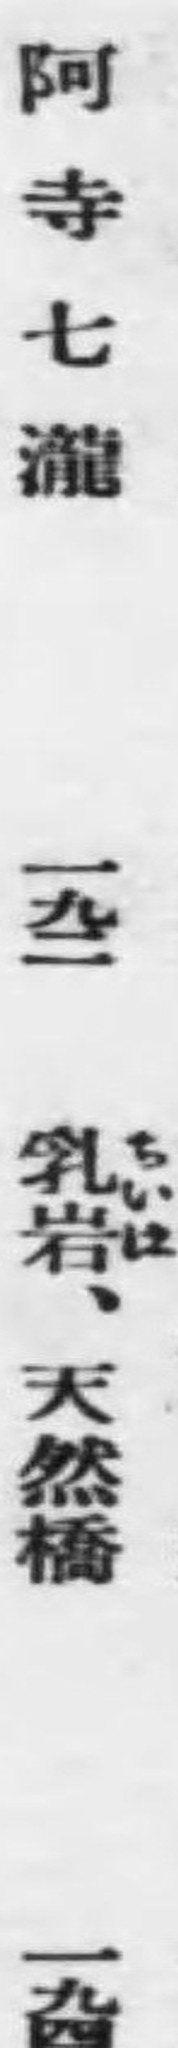阿寺七瀧一九二乳岩、天然橋一九四

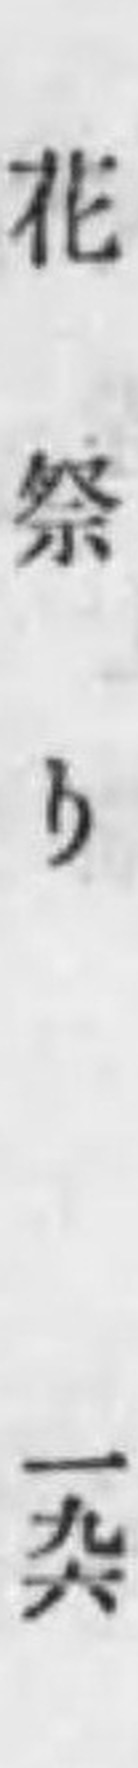花祭り一九六
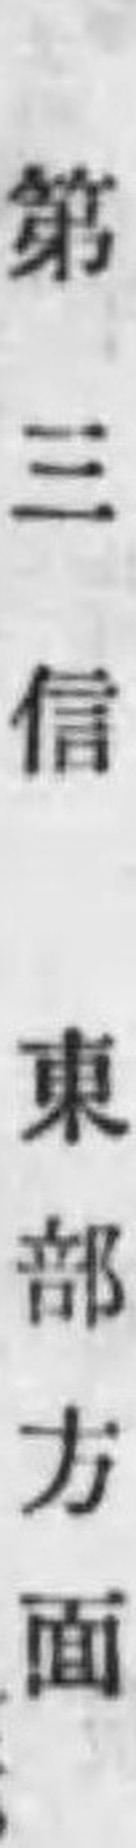第三信東部方面
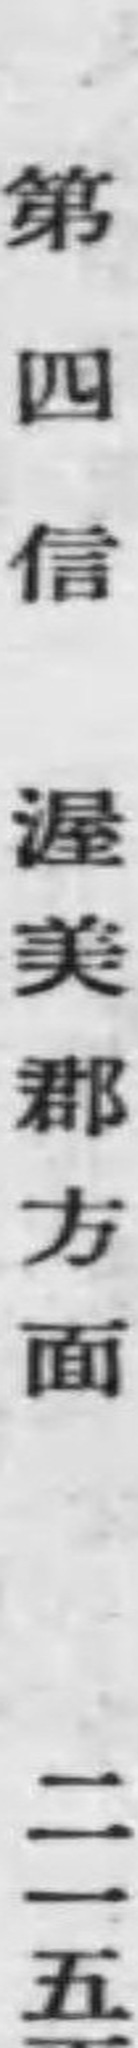第四信渥美郡方面二一五頁

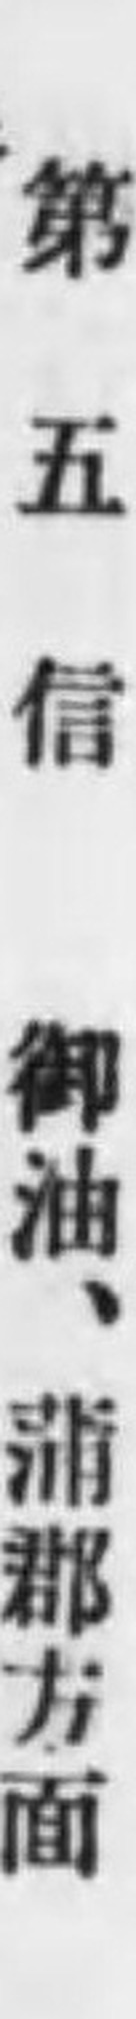第五信御油、蒲郡方面
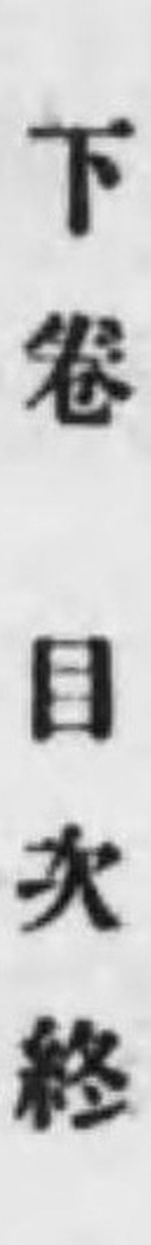下巻目次終
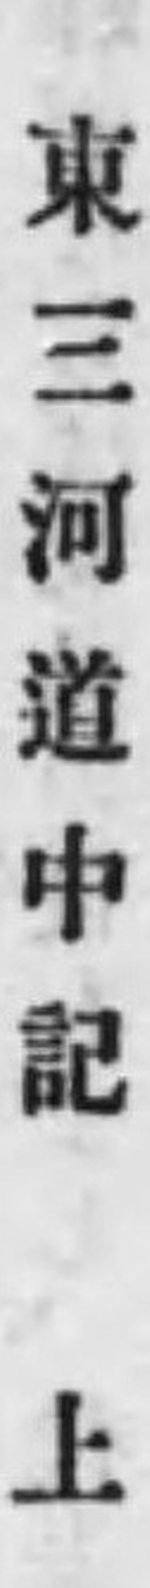東三河道中記上
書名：東三河道中記 : 豊橋市及其附近案内
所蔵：国立国会図書館 National Diet Library, JAPAN
